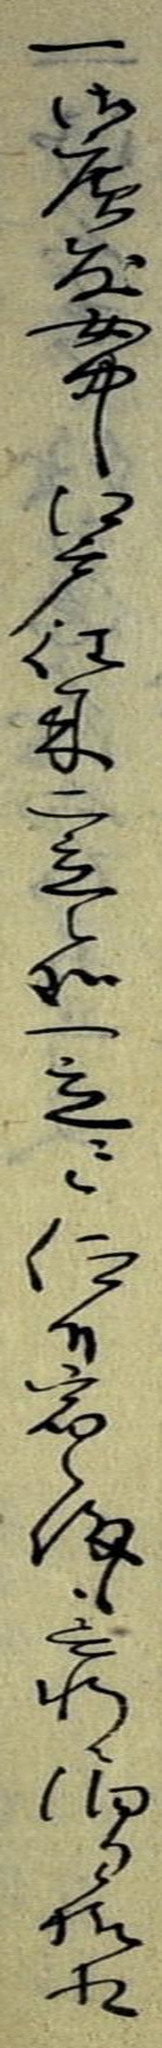一御広敷女中江戸往来二立之処一立に被仰付宿之儀も壱軒に泊り候様相
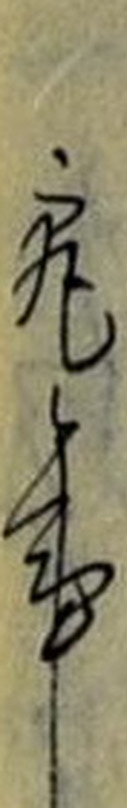究候事
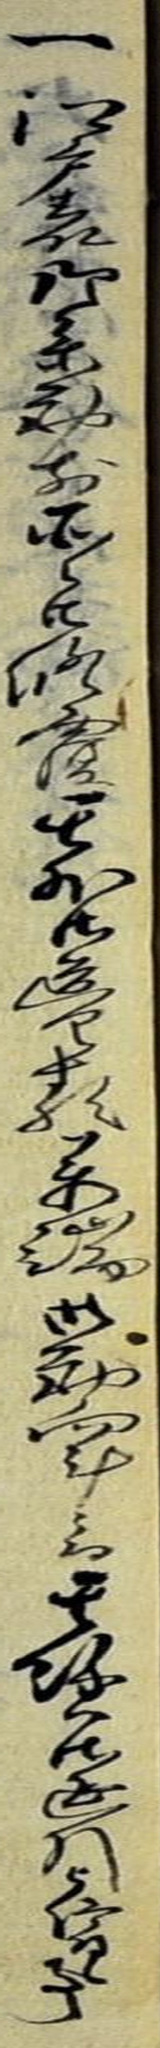一江戸表御参勤前所々御修覆其外御道具類万端御勤向斗に而其余は御延引被仰付候事
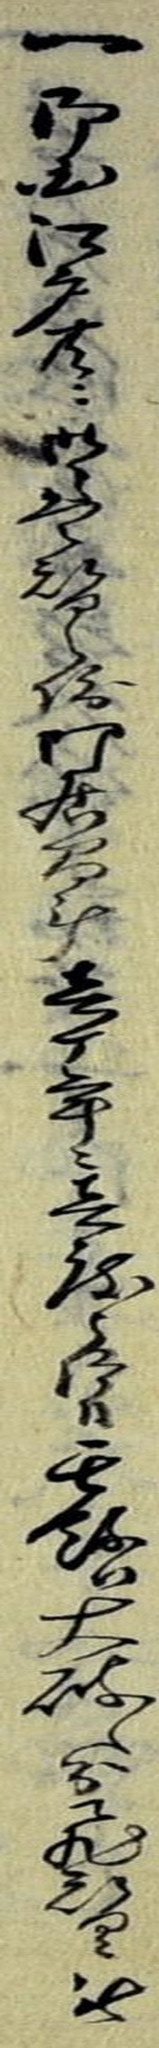一御国江戸共に御畳替之儀御居間斗壱ヶ年に壱度被仰付其余は大破之分飛替に被
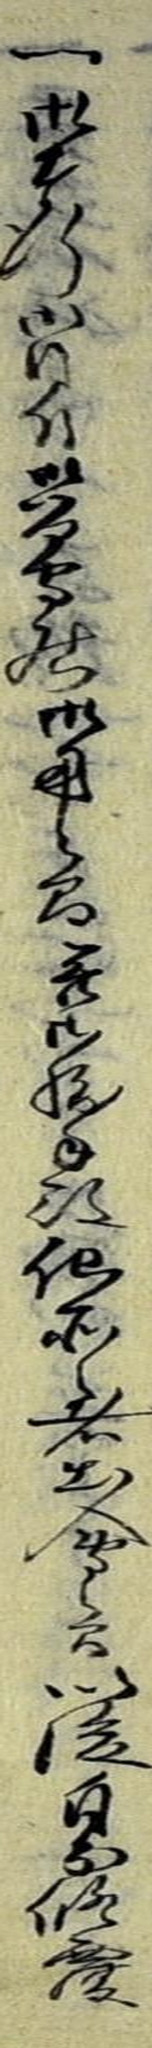一御奉行御目付御留守居御用之間并御勝手役他所之者出会之間以後自分修覆
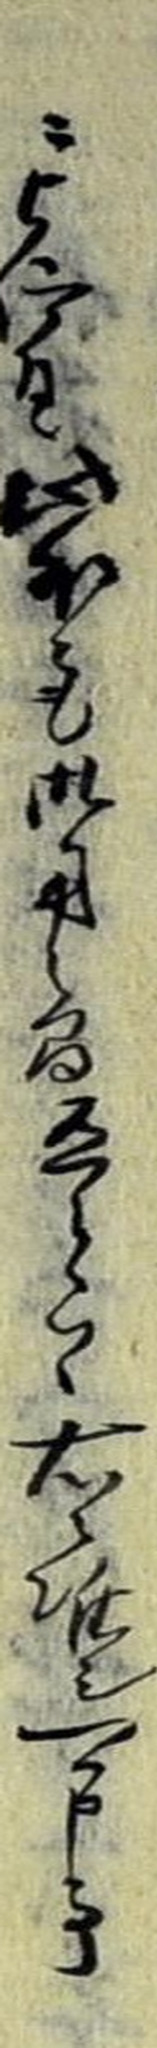に被仰付候此外にも御用之間有之候はゝ右に准し可申事
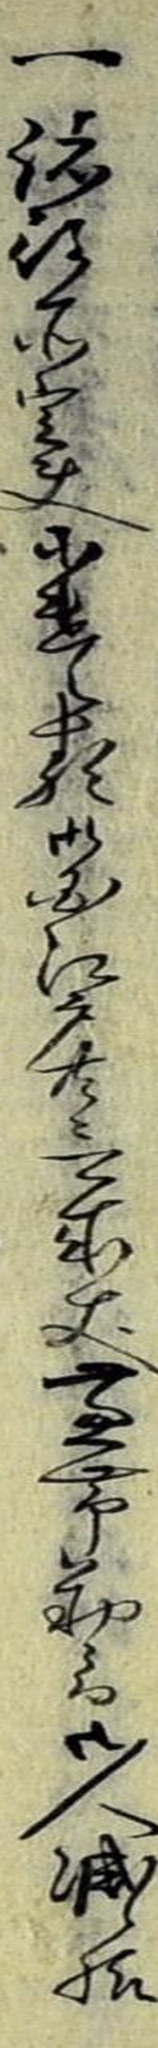一諸役所定夫小遣之類御国江戸共に可成丈兼帯勤に而御人減候様
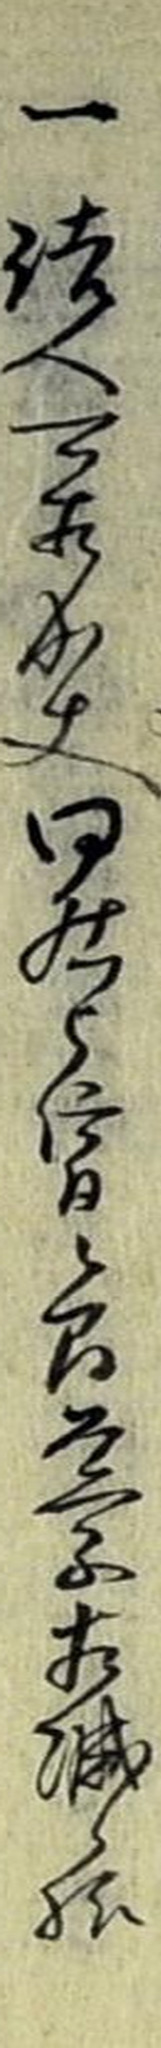一詰人可相成丈同居被仰付候間荒子相減候様
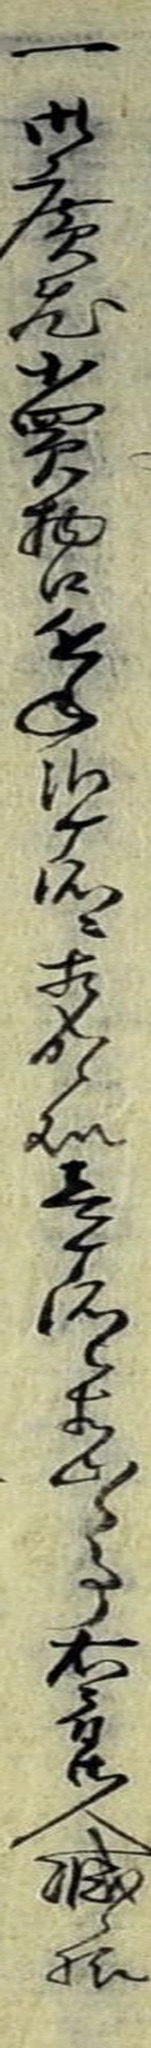一御広敷小買物口近年弐ケ所に相成候処壱ケ所被相止候事右に付御人減候様
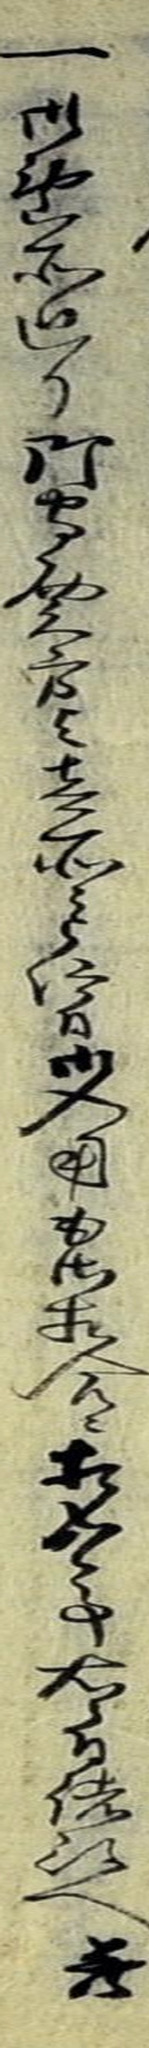一御台所廻り御守殿方与壱所に被仰付御入用も御相合に相成候事右に付諸役人并
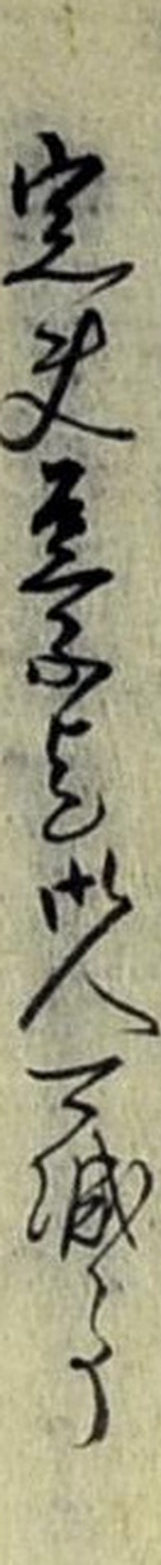定夫荒子迄御人可減事
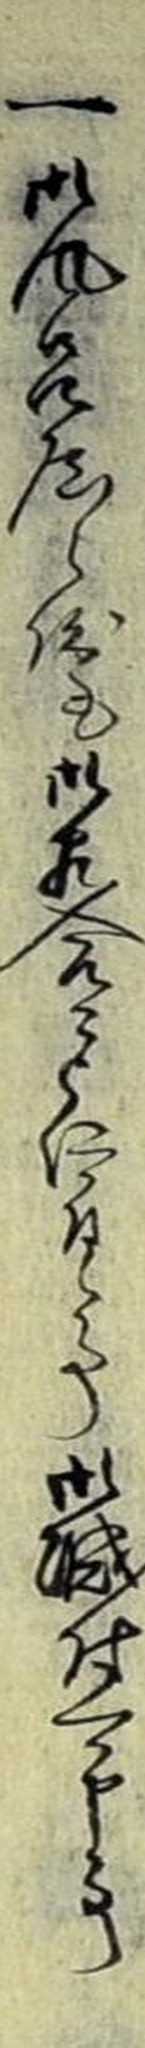一御風呂屋之儀も御相合に被仰付候事御減付可申事
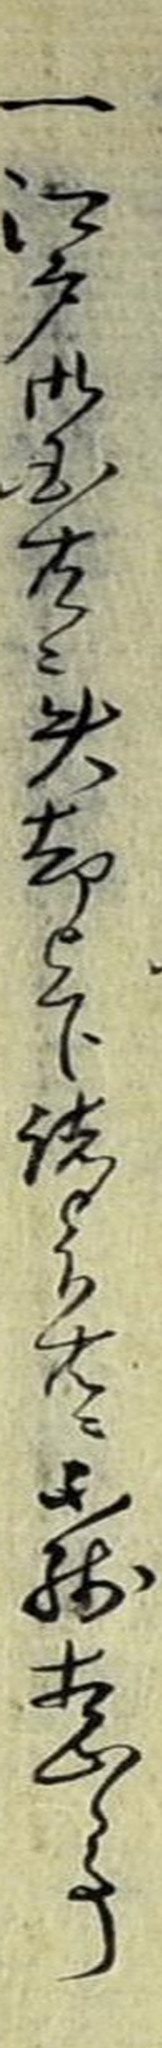一江戸御国共に失却被下諸被下共に不残相止候事
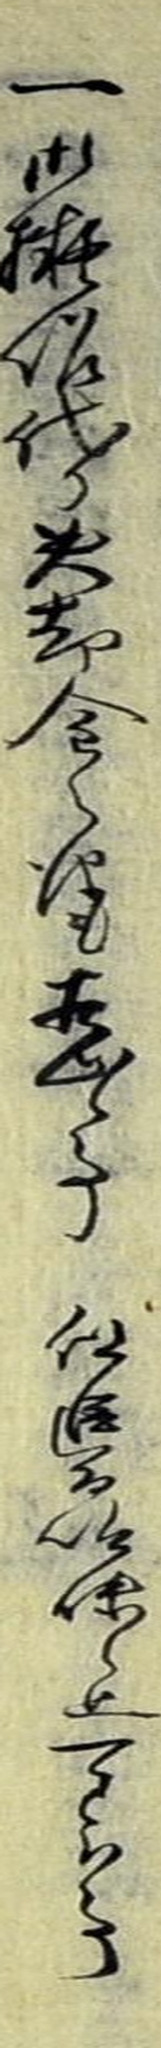一御擬作代り失却金之儀も相止候事但追而吟味之上可被下事
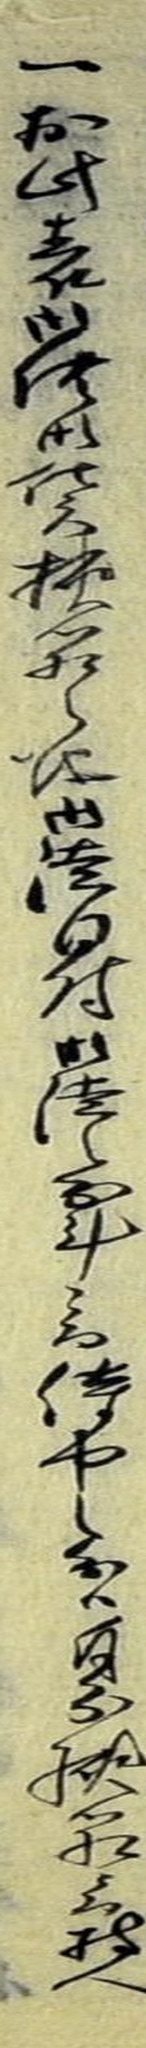一於此表御供御貸挟箱之儀御徒目付御徒之分斗に而侍中之分は自分挟箱に而持人
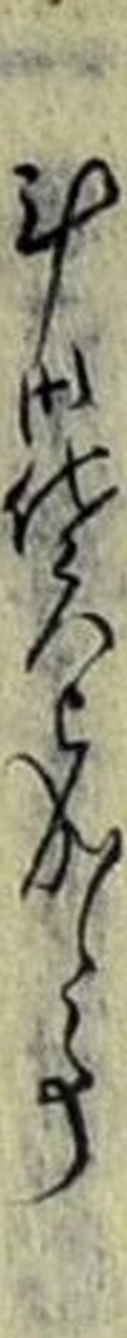斗御貸被成候事
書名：命令之部 二
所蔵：福井県文書館 Fukui Prefectural Archives
